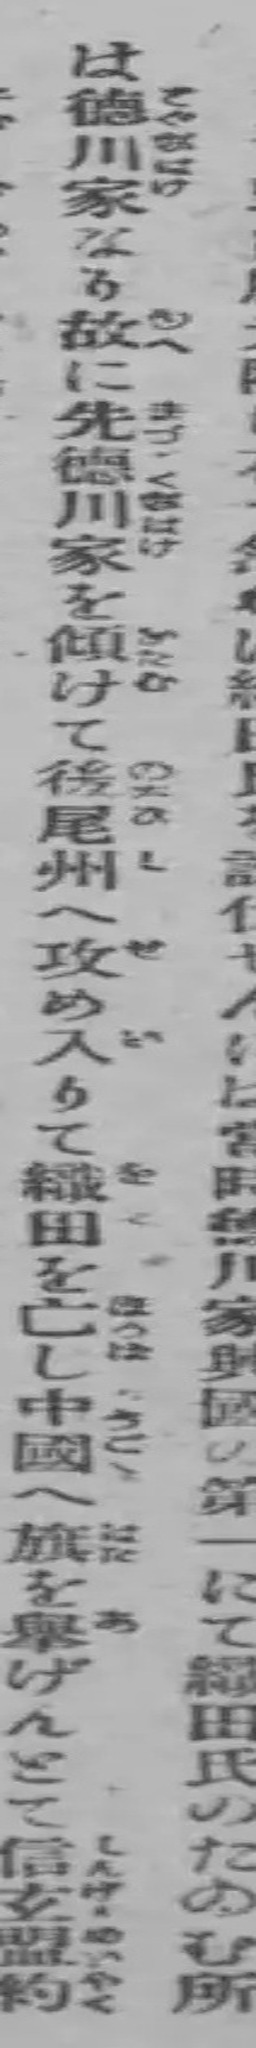は徳川家なり故に先徳川家を傾けて後尾州へ攻め入りて織田を亡し中国へ旗を挙げんとて信玄盟約
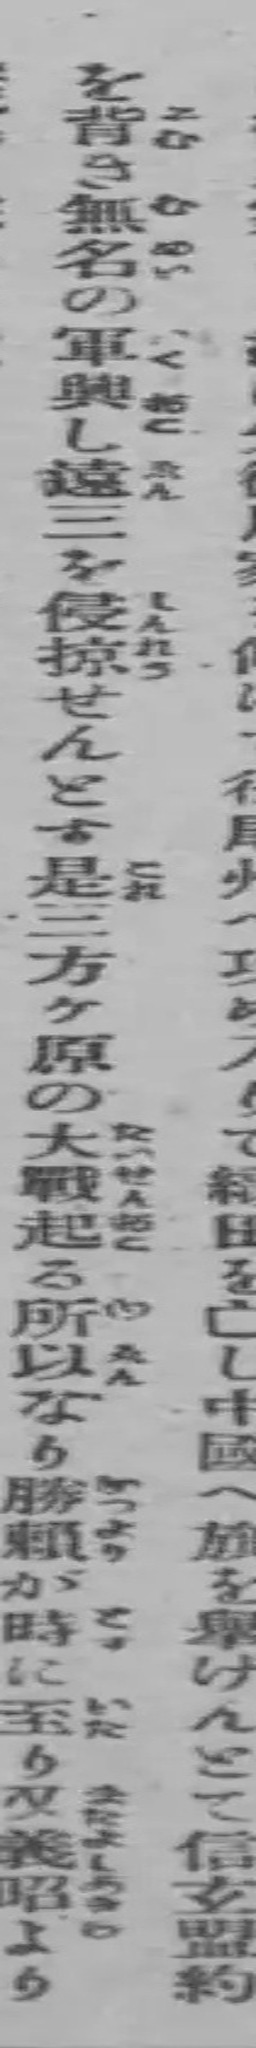を背き無名の軍興し遠三を侵掠せんとす是三方ヶ原の大戦起る所以なり勝頼が時に至り又義昭より
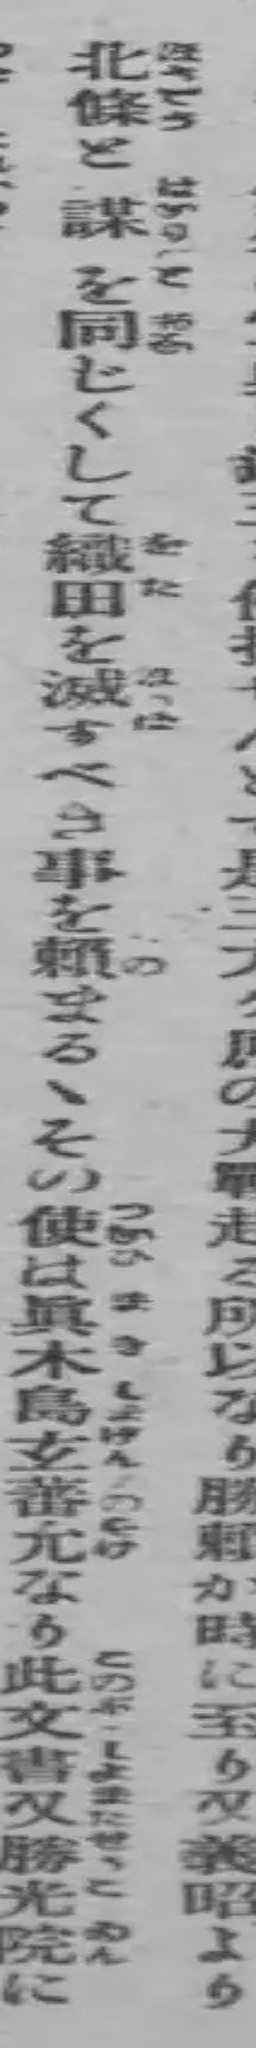北条氏謀を同じくして織田を滅すべき事を頼まるゝその使は眞木島玄蕃允なり此文書又勝光院に
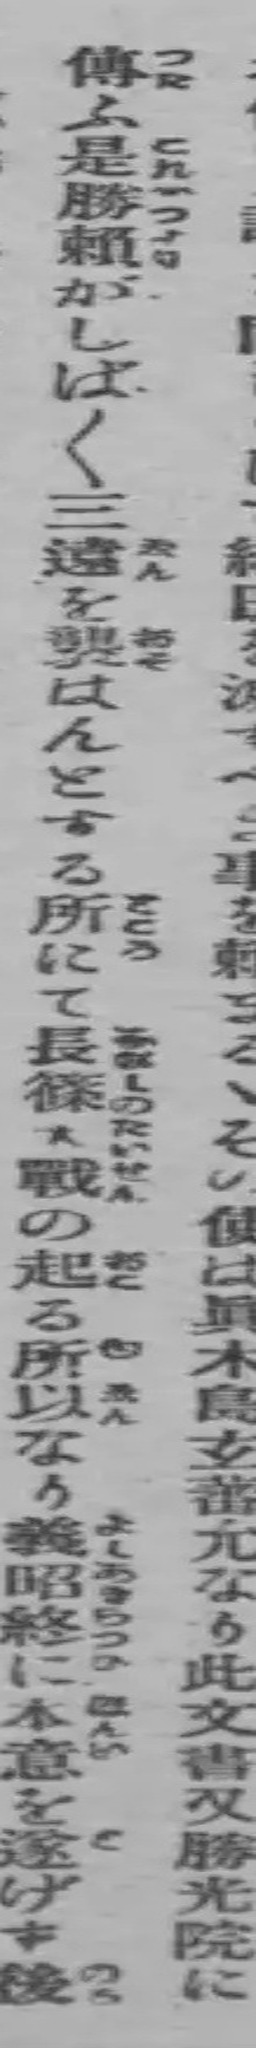伝ふ是勝頼がしば〳〵三遠を襲はんとする所にて長篠大戦の起る所以なり義昭終に本意を遂げず後
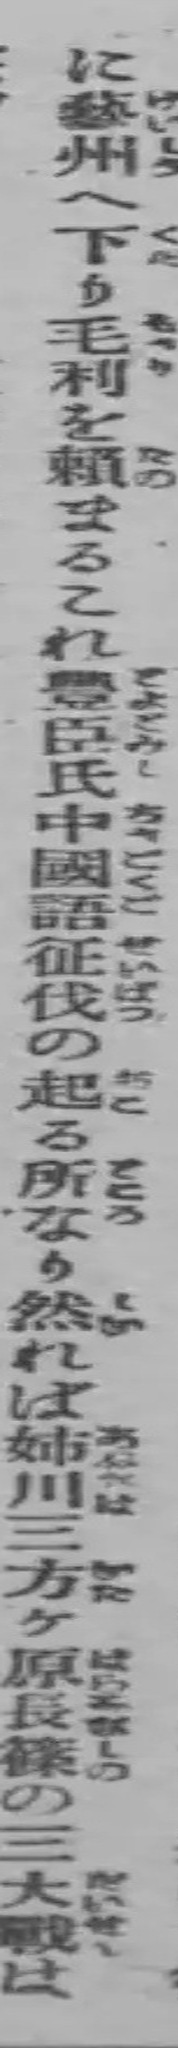に芸州へ下り毛利を頼まるこれ豊臣氏中国語征伐の起る所なり然れば姉川三方ヶ原長篠の三大戦は
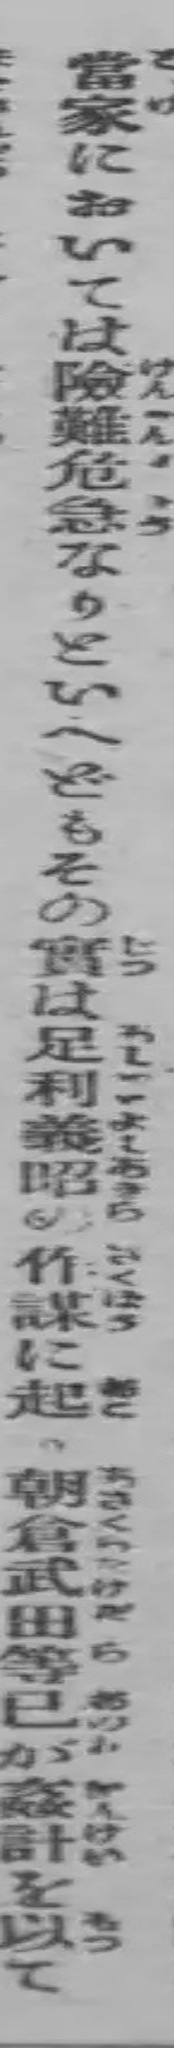当家においては剣難危急なりといへどもその実は足利義昭の作謀に起り朝倉武田等巳が姦計を以て
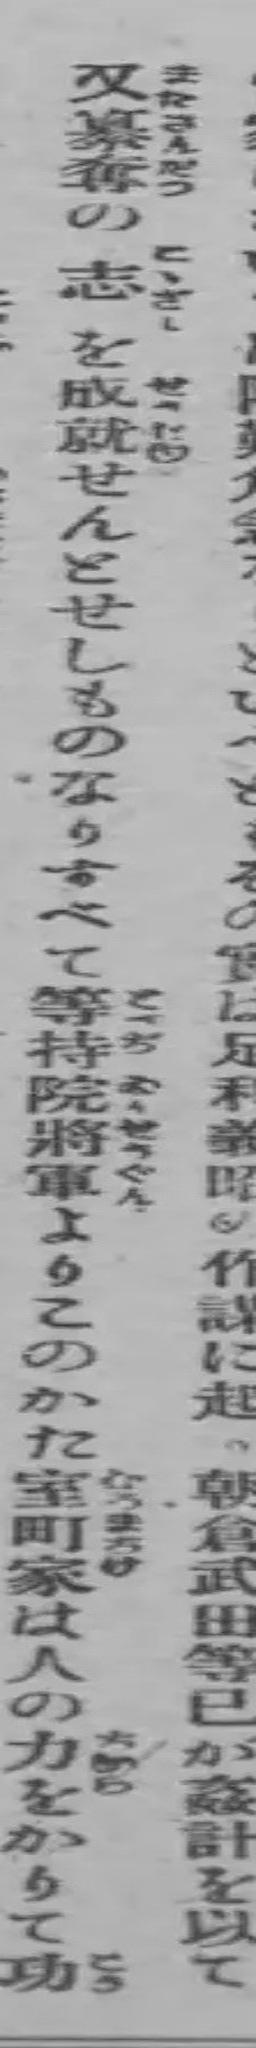又簒奪の志を成就せんとせしものなりすべて等持院将軍よりこのかた室町気は人の力をかりて功
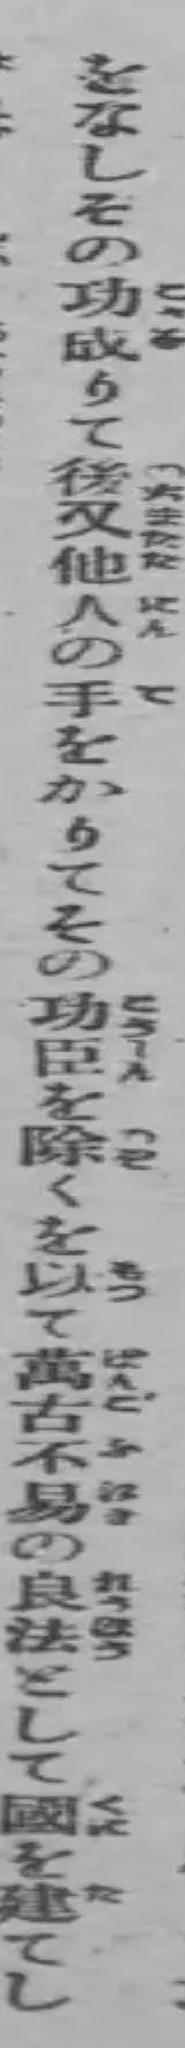をなしその功成りて後又他人の手をかりてその功臣を除くを以て万古不易の良法として国を建てし
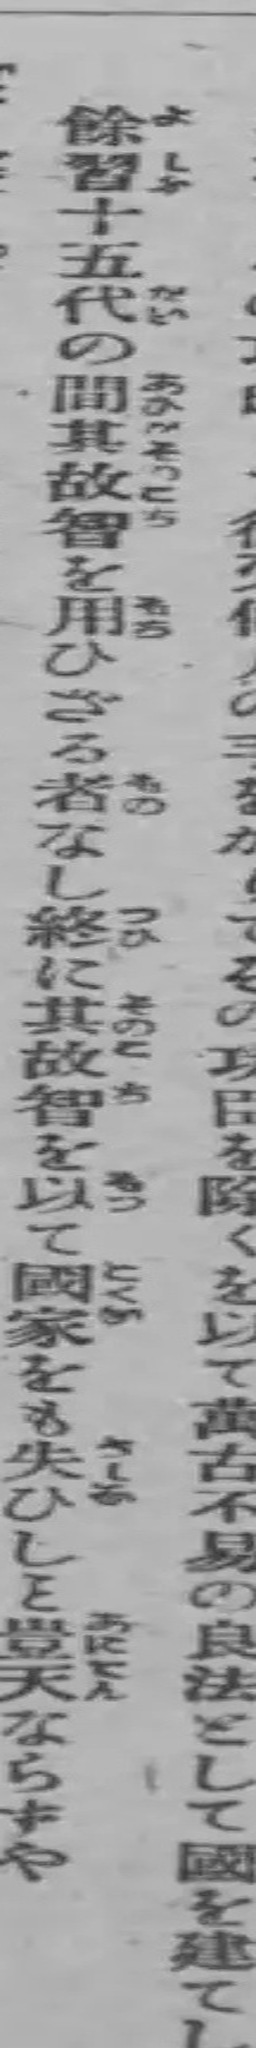余習十五代の間其故智を用ひざる者なし終に其故智を以て国家をも失ひしこと豈天ならずや
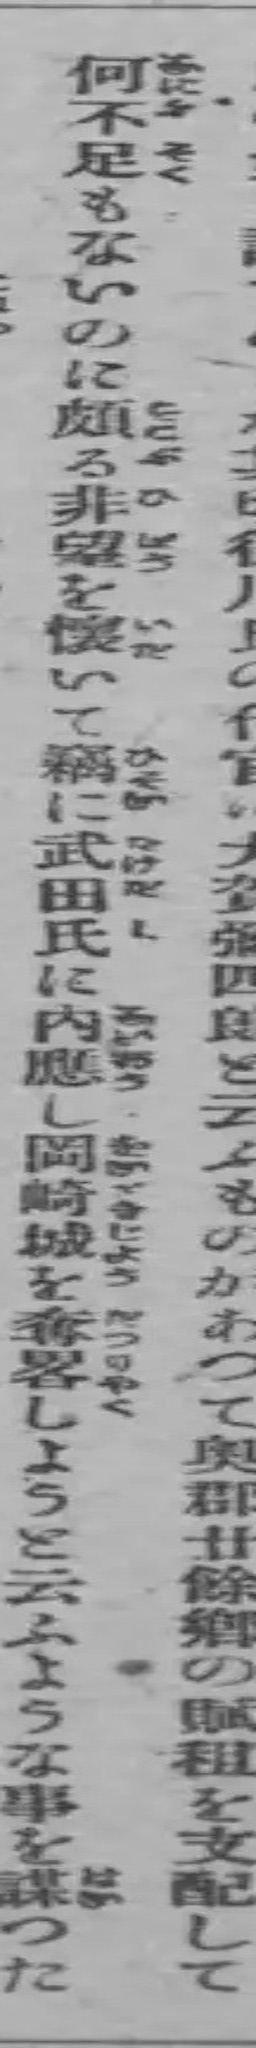何不足もないのに頗る非望を懐いて竊に武田氏に内応し岡崎城を奪略しようと云ふような事を謀つた
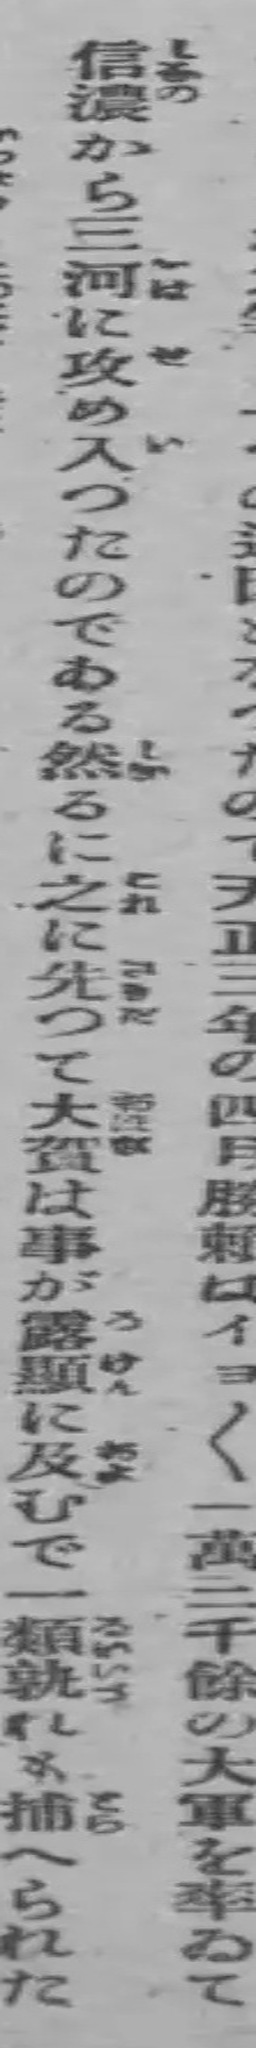信濃から三河に攻め入つたのである然るに之に先つて大賀は事が露顕に及むで一類孰れも捕へられた
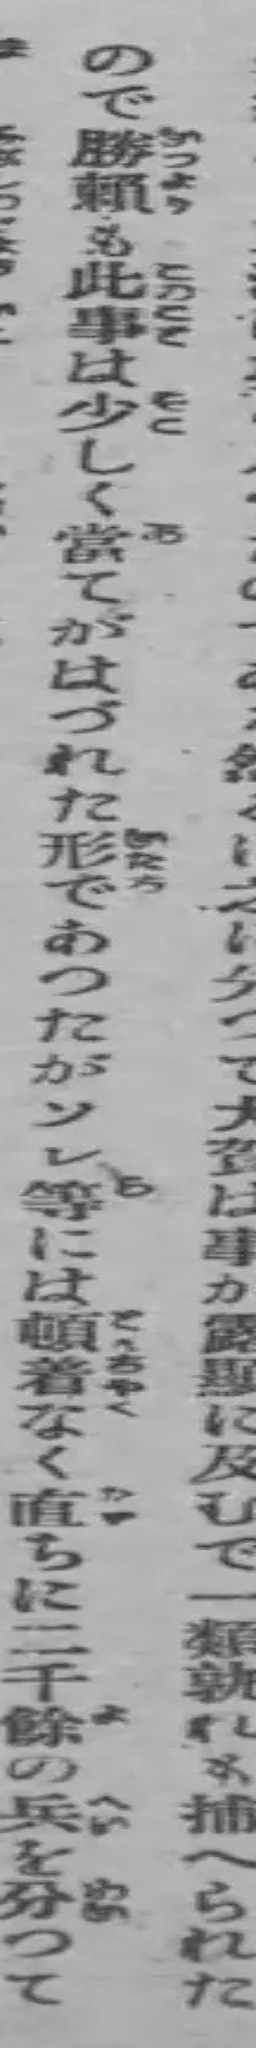ので勝頼も此事は少しく当てがはづれた形であつたがソレ等には頓着なく直ちに二千余の兵を分つて
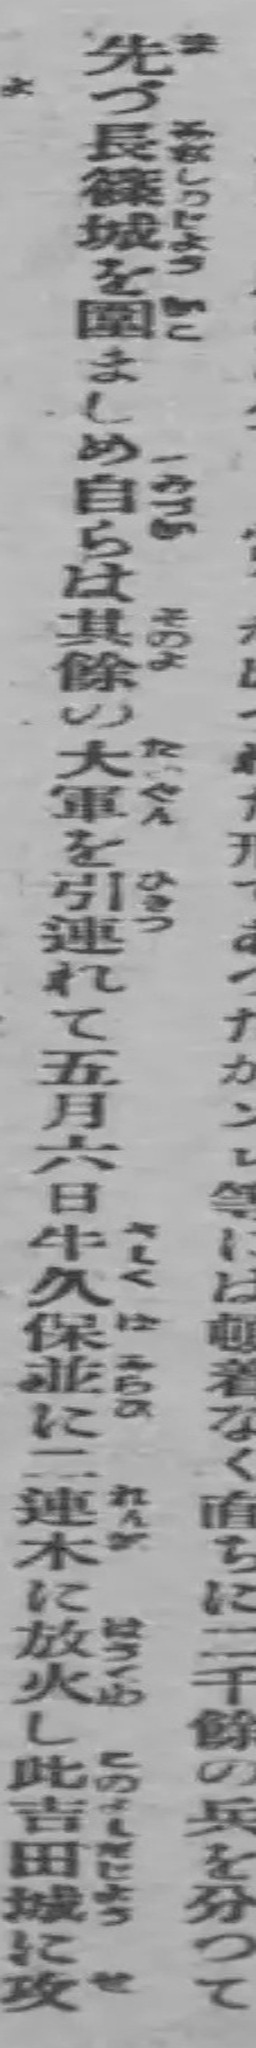先づ長篠城を囲ましめ自らは其余の大軍を引連れて五月六日牛久保並に二連木に放火し此吉田城に攻
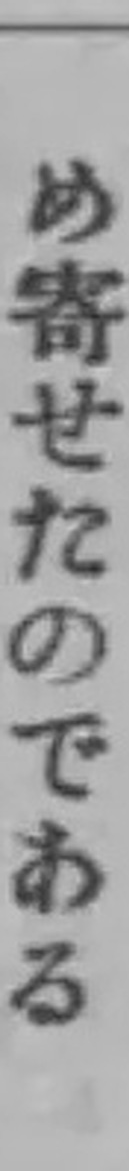め寄せたのである
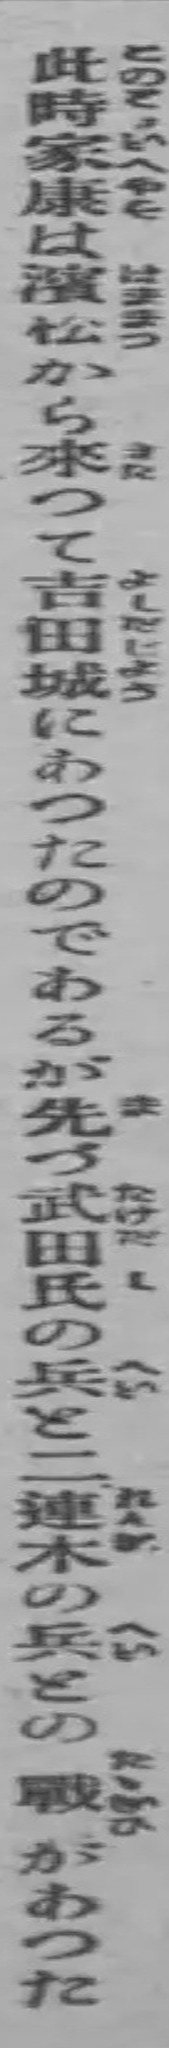二連木の戦此時家康は浜松から来つて吉田城にあつたのであるが先づ武田氏の兵と二連木の兵との戦があつた
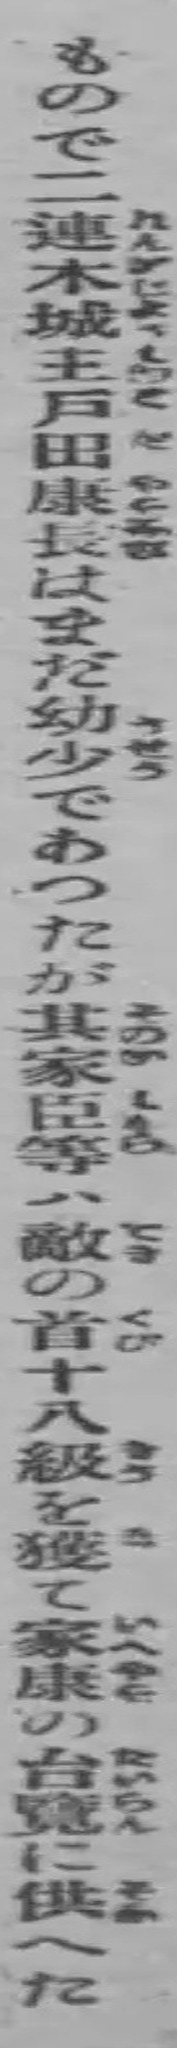もので二連木城主戸田康長はまだ幼少であつたが其家臣等ハ敵の首十八級を獲て家康の台覧に供へた
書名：豊橋市史談
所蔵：国立国会図書館 National Diet Library, JAPAN
